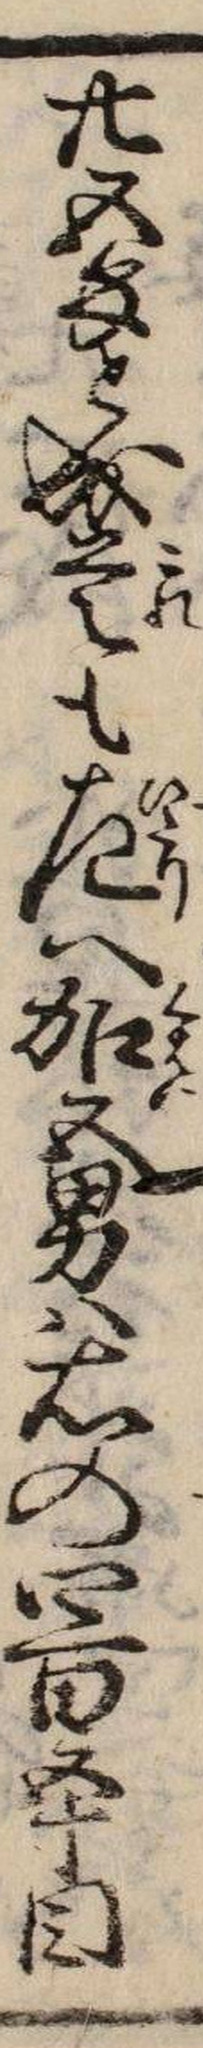廿五匁と成是も左へ加五男は右の四百五十目
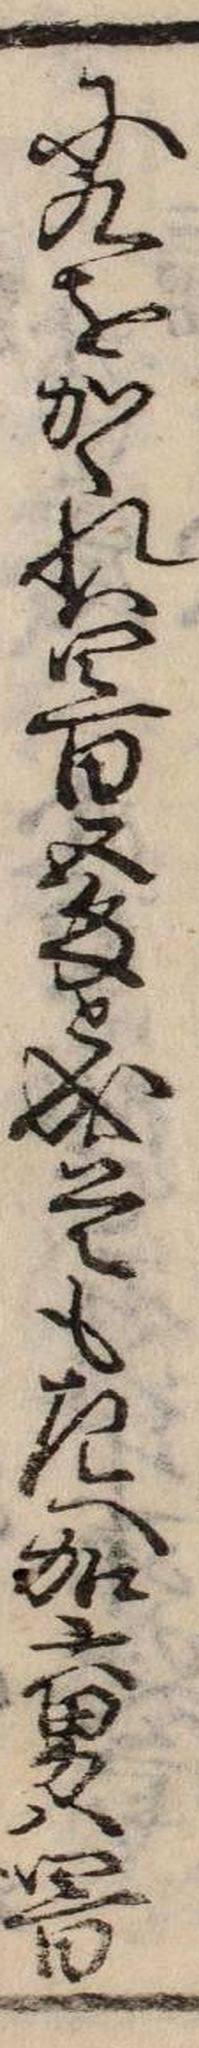に九をかくれは四百五匁と成是も左へ加六男は四百
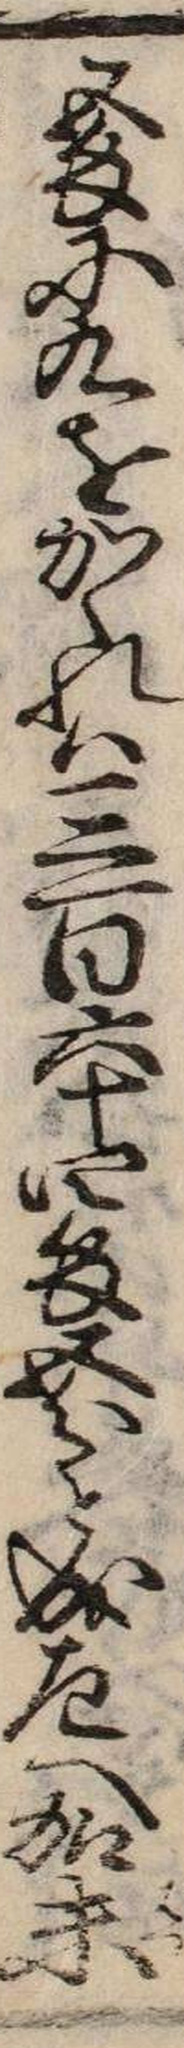五匁に九をかくれは三百六十四匁五分と成左へ加末
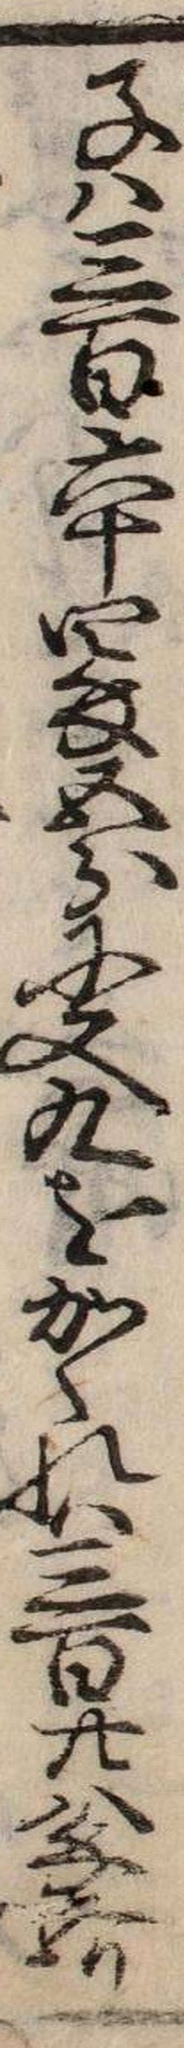子は三百六十四匁五分に又九をかくれは三百廿八匁五り
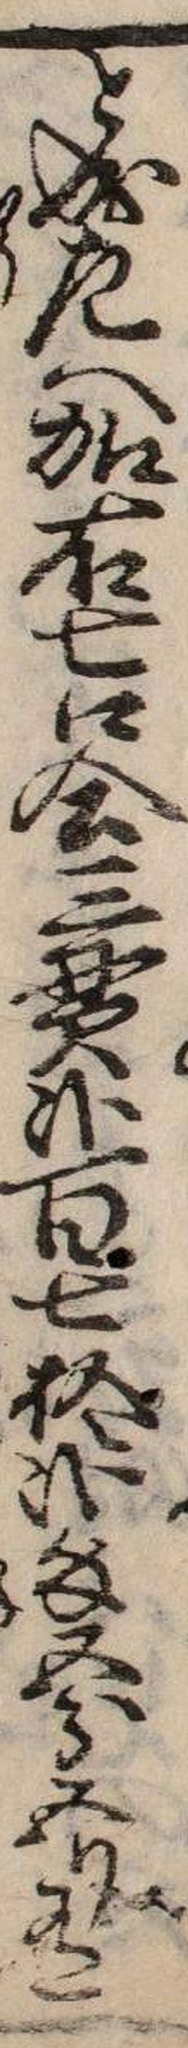と成左へ加右七口合三貫弐百七拾弐匁五分五り有
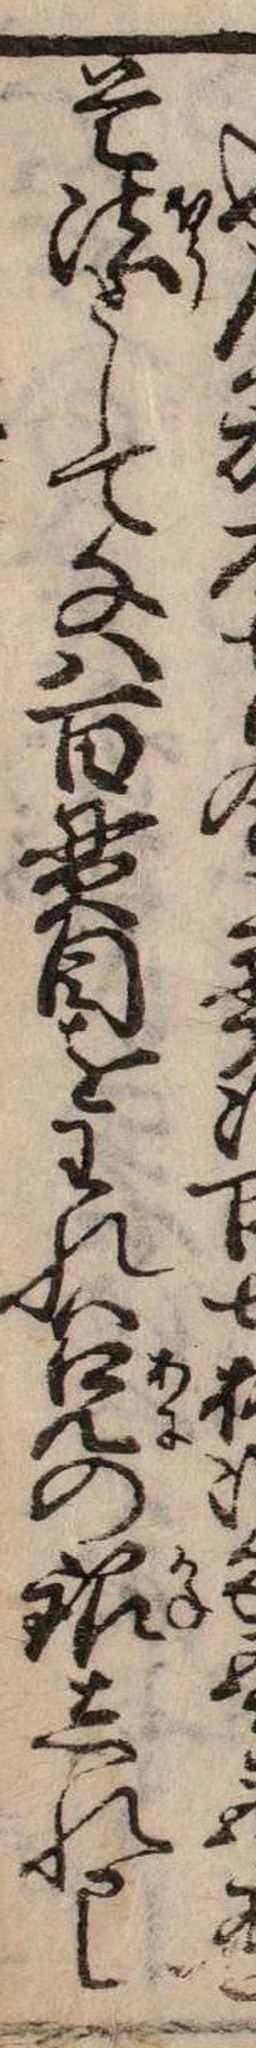是法として千八百貫目をわれは兄の銀しれ申候

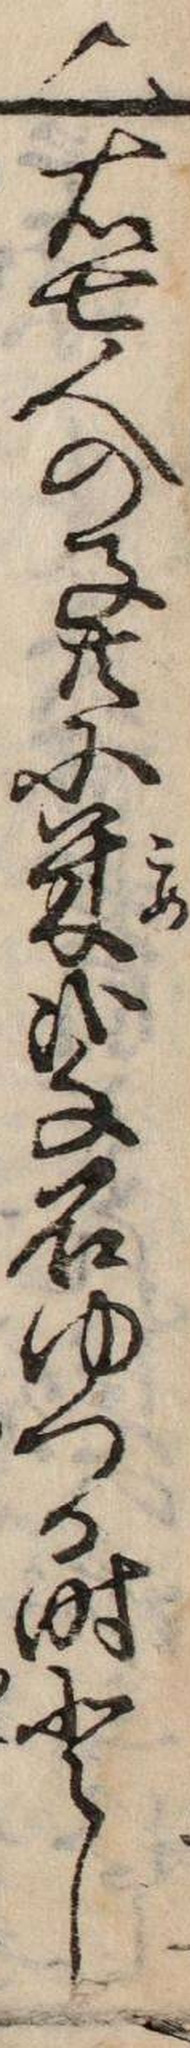右七人の子共に米弐千石ゆつる時とし
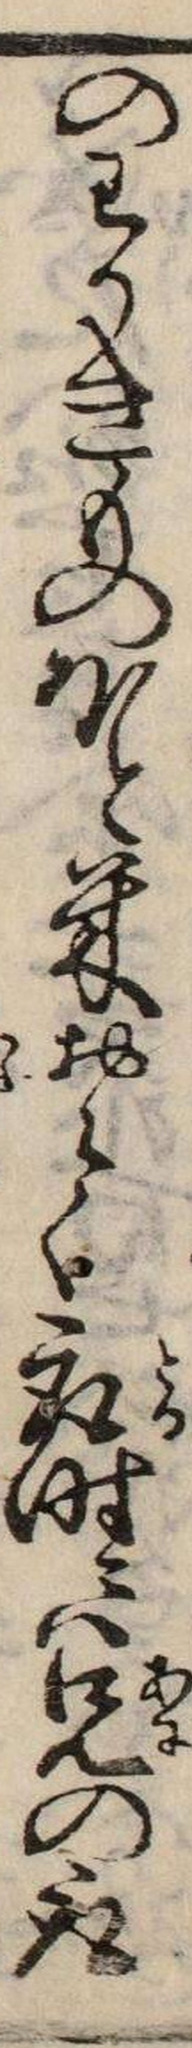のわかきものほと米おゝく取時には兄の取
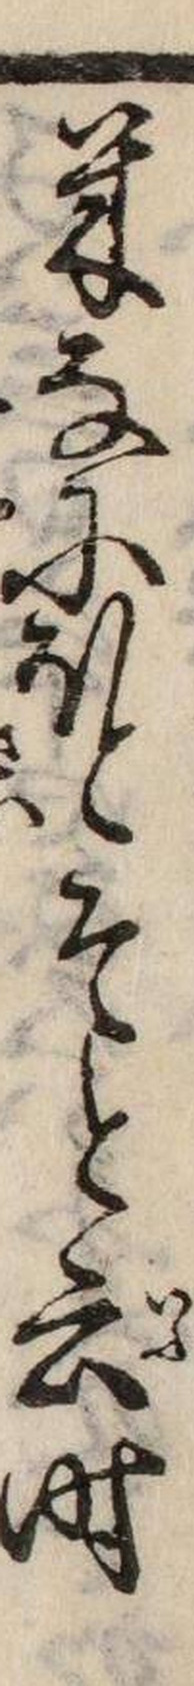米なにほとそと云時
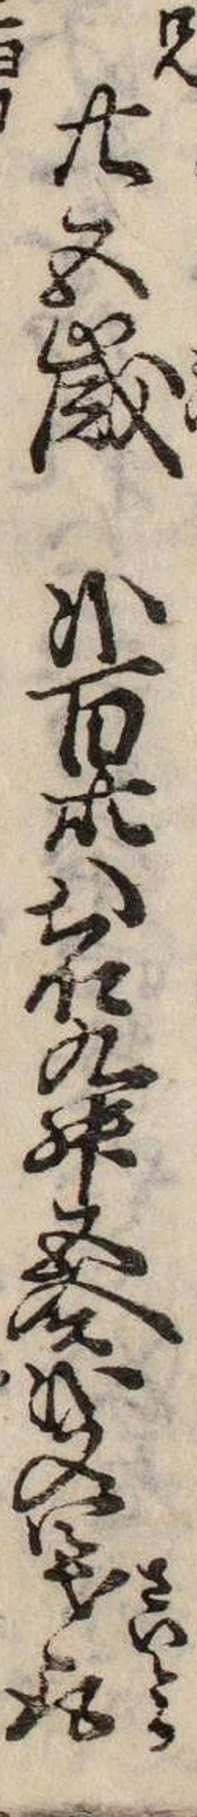兄廿五歳弐百卅八石九升五合弐勺四才取
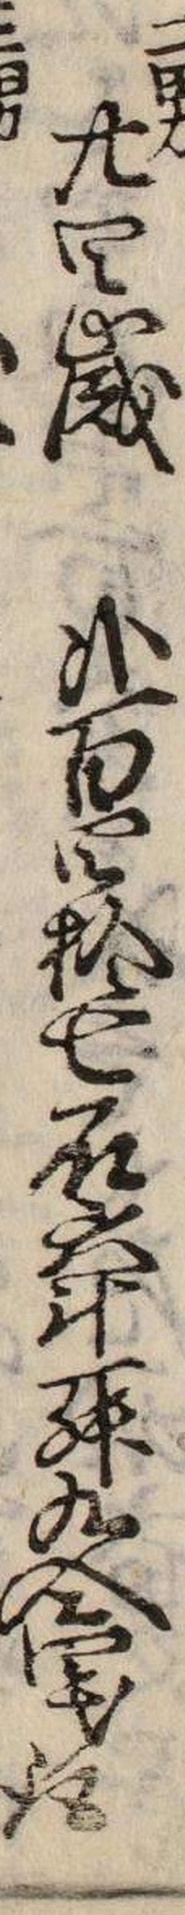二男廿四歳弐百四拾七石六斗一升九合四才取
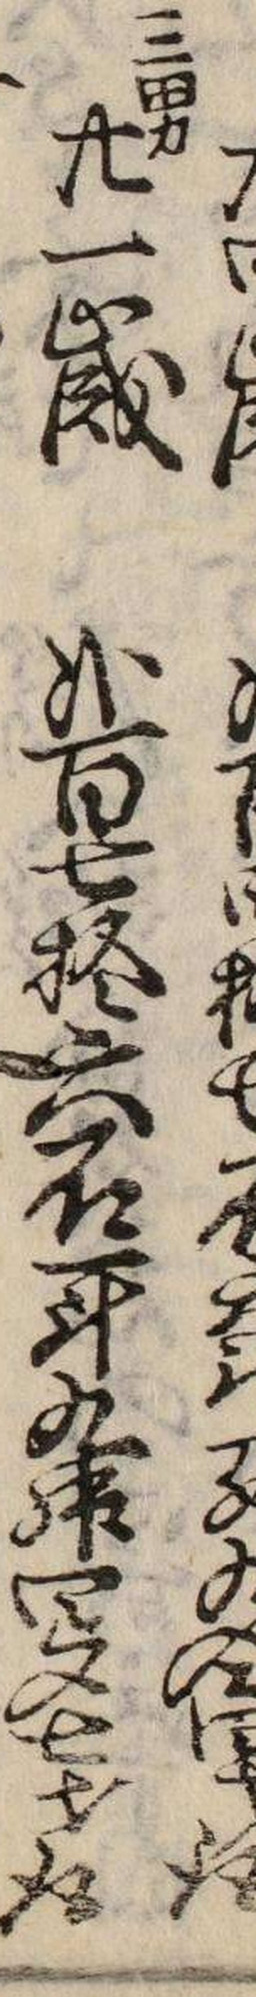三男廿一歳弐百七拾六石一斗九升四勺七才取
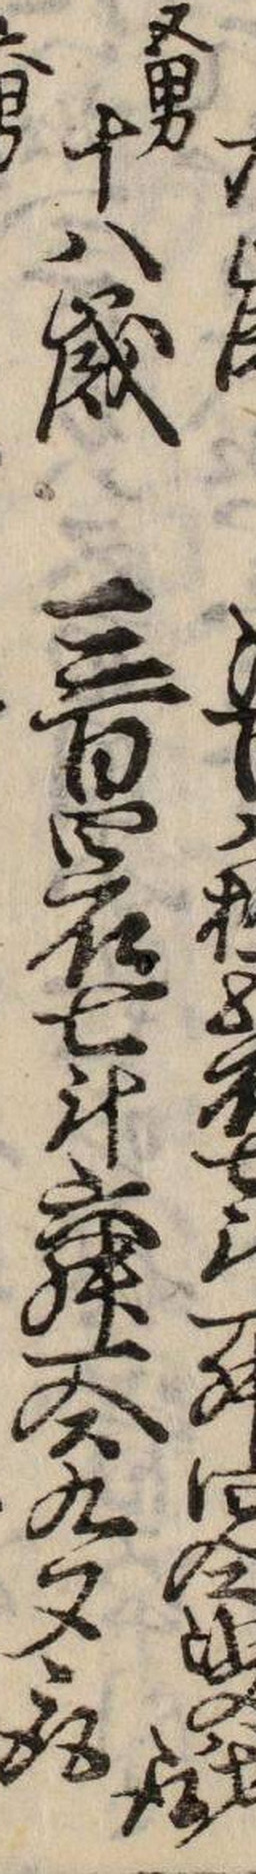五男十八歳三百四石七斗六升一合九勺取
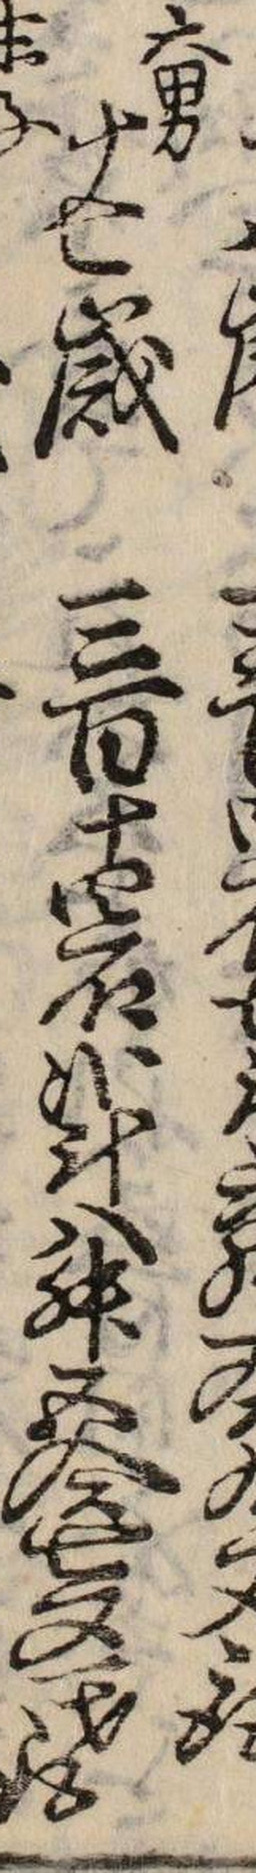六男十七歳三百十四石弐斗八升五合七勺一才取
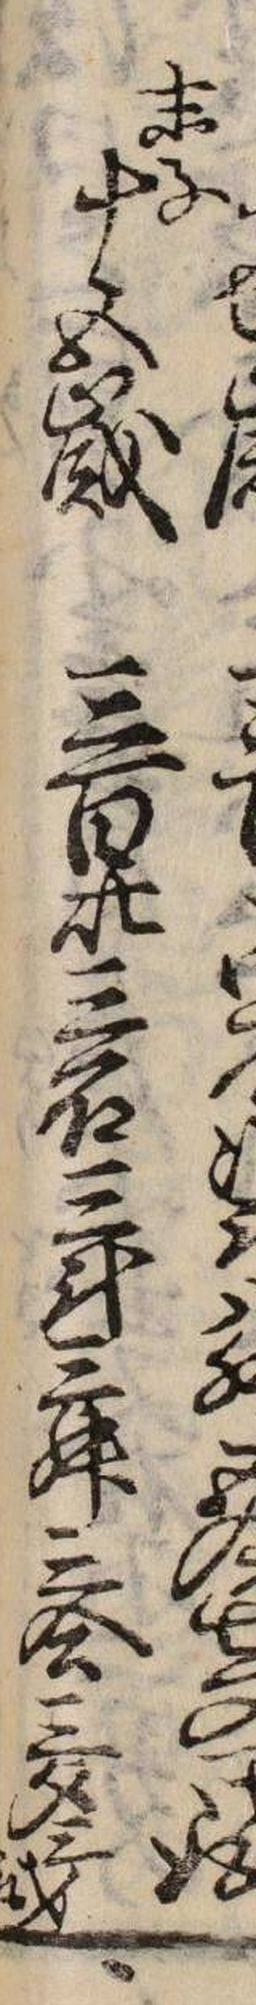末子十五歳三百卅三石三斗三升三合三勺三才取
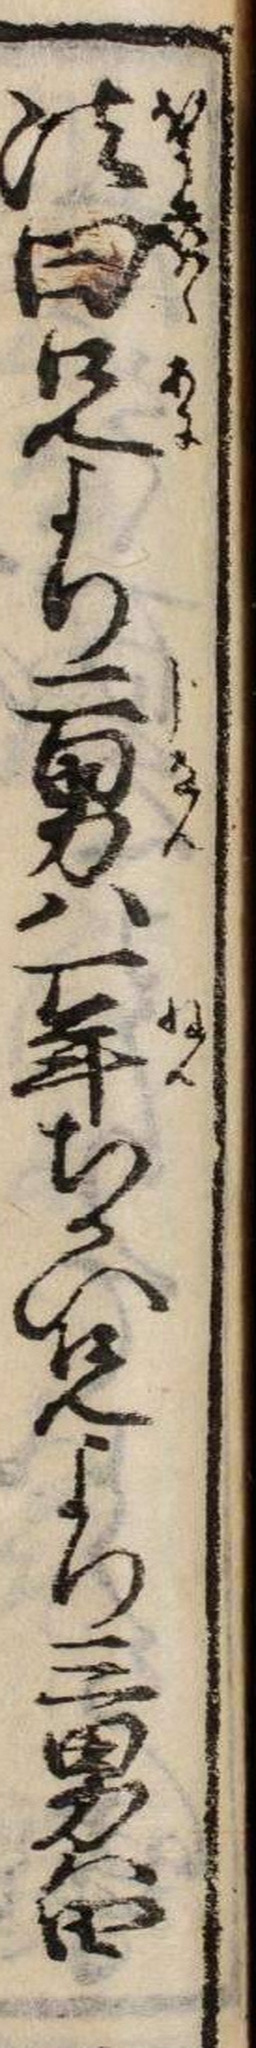法曰兄より二男は一年ちかい兄より三男は四
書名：塵劫記（寛永11年自跋、京都府立京都学・歴彩館追貴8）
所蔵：京都府立京都学・歴彩館 国文学研究資料館
